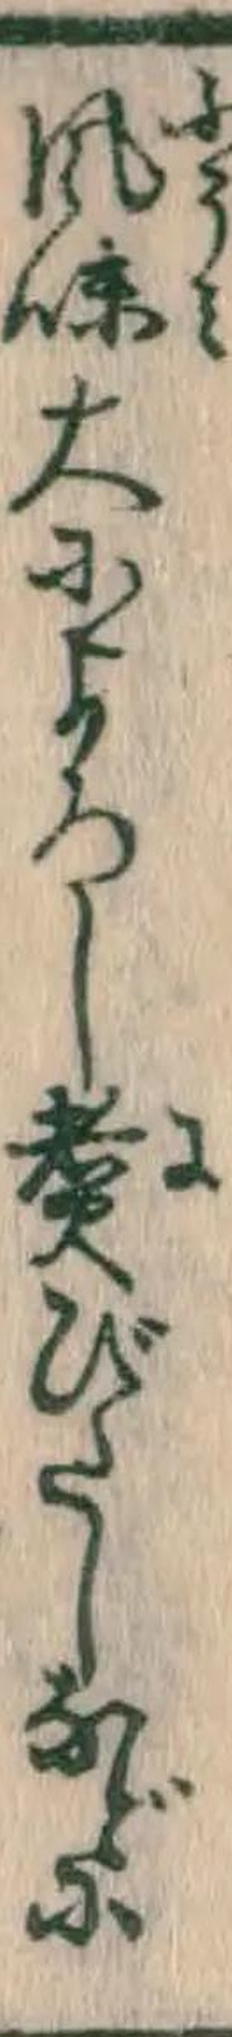風味大によろし煮びたしなどに
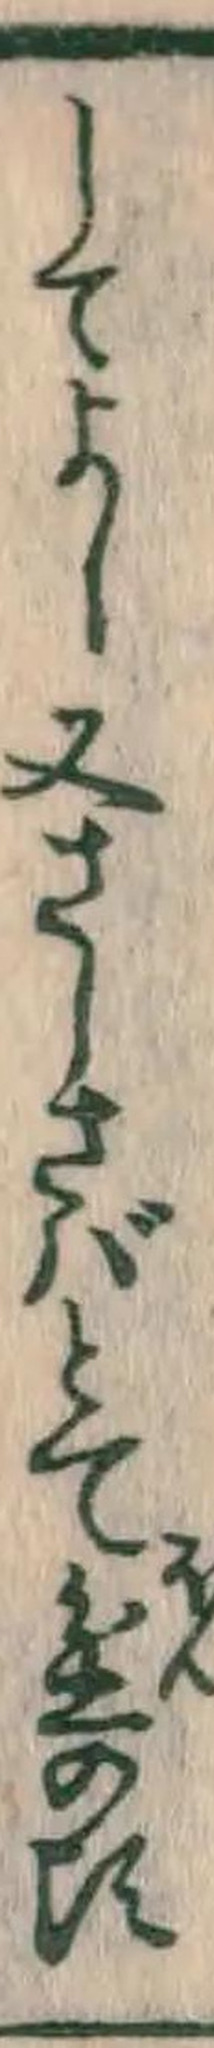してよし又さしさばとて盆の頃
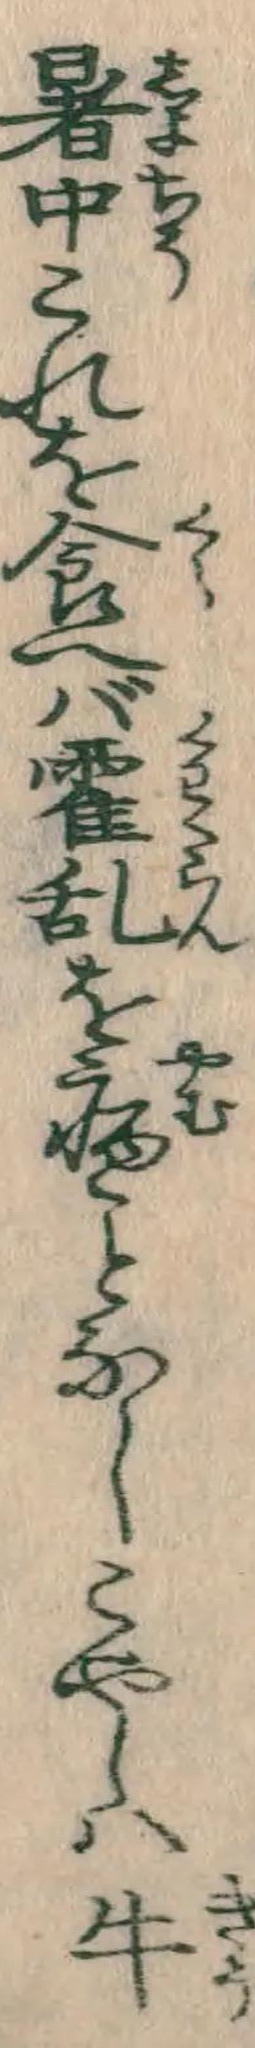暑中これを食へば霍乱を病ことなしこやしは牛
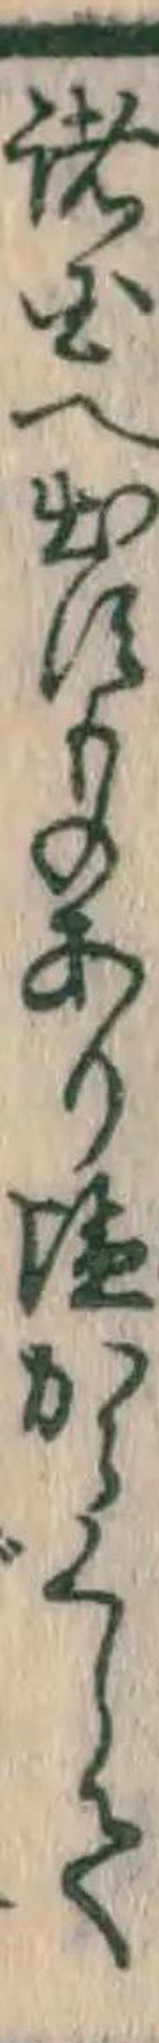諸国へ出すものあり塩からくして
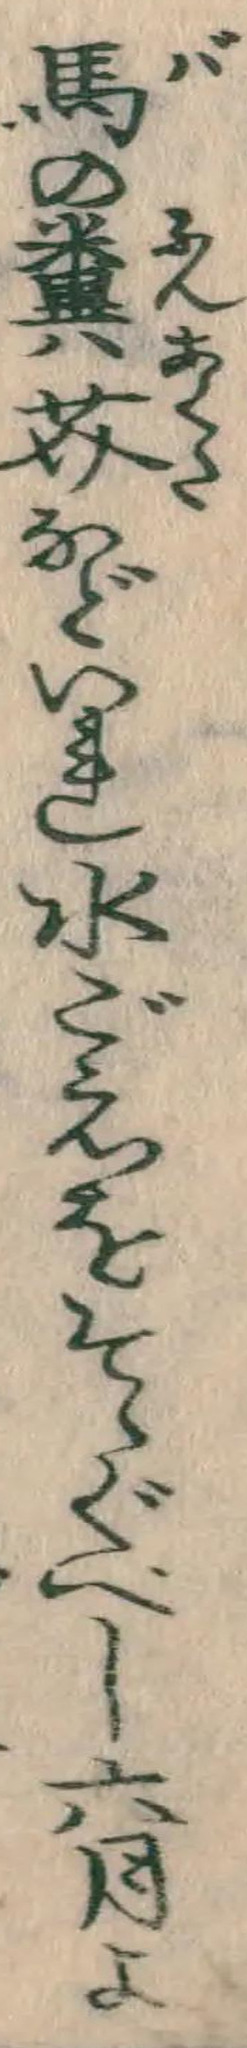馬の糞芥などいれ水ごえをそゝぐべし六月よ
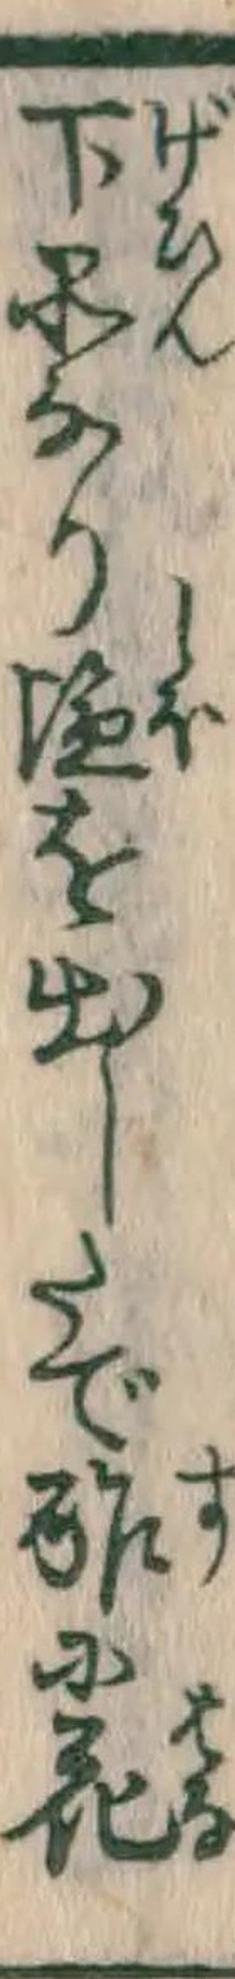下品なり塩を出したで酢に花
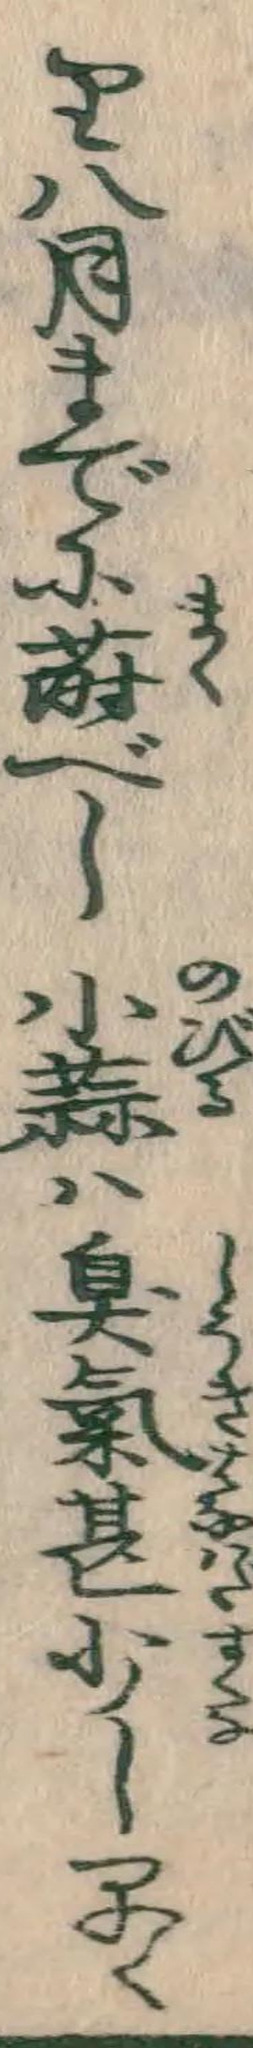り八月までに蒔べし小蒜は臭気甚少し早く
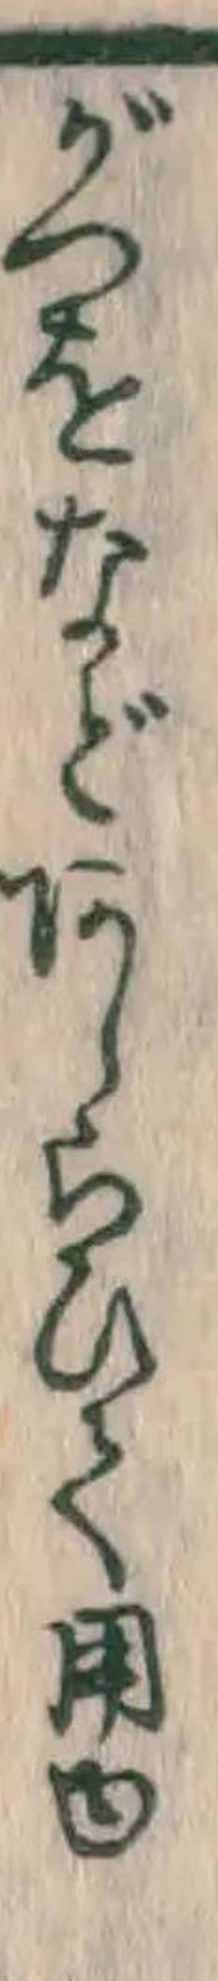がつをなどあしらひて用ゆ
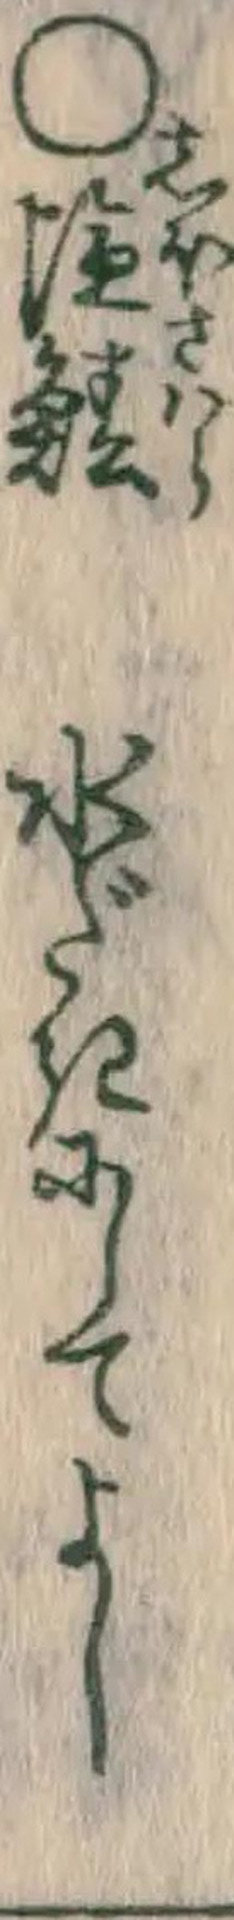○塩鰆水だきにしてよし
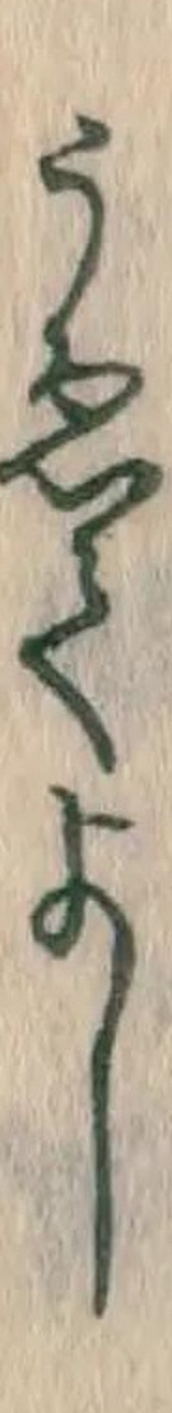うゑてよし
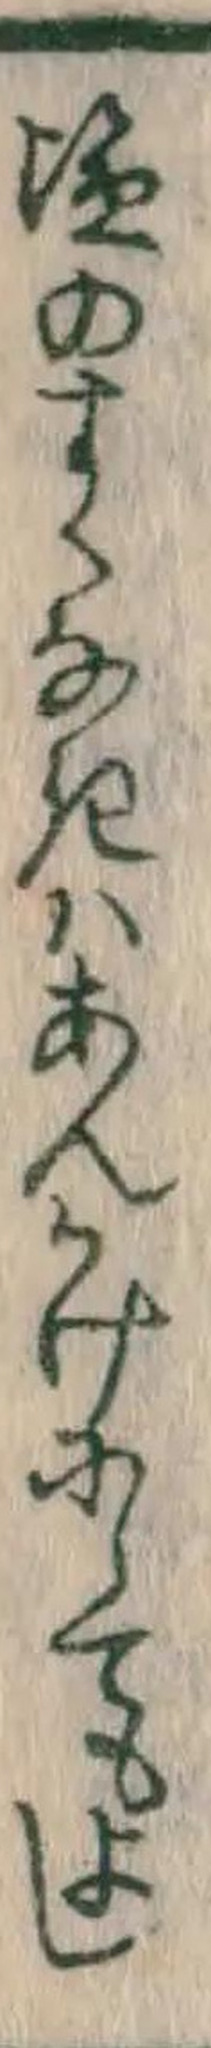塩のすくなきはあんかけにしてもよし
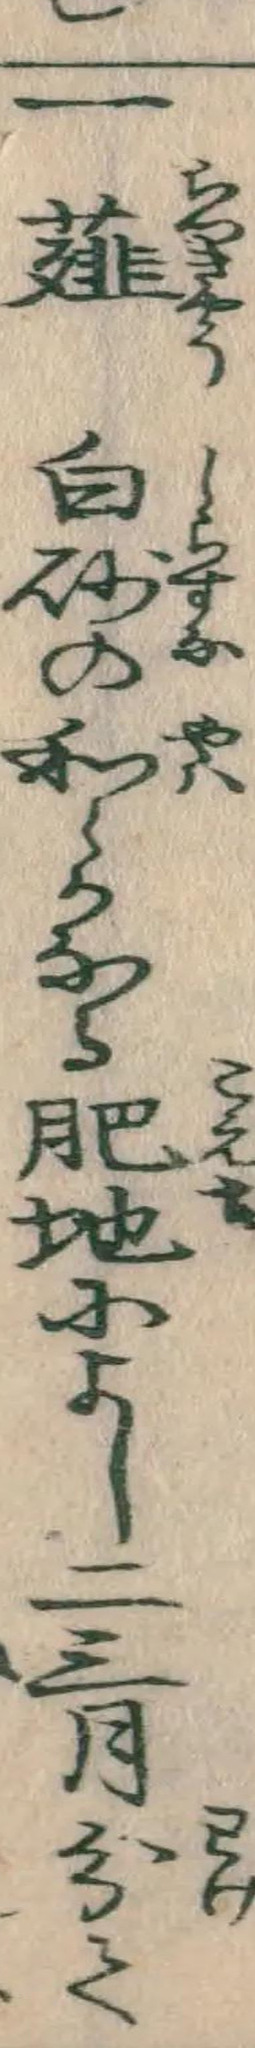一薤白砂の和らかなる肥地によし二三月分て
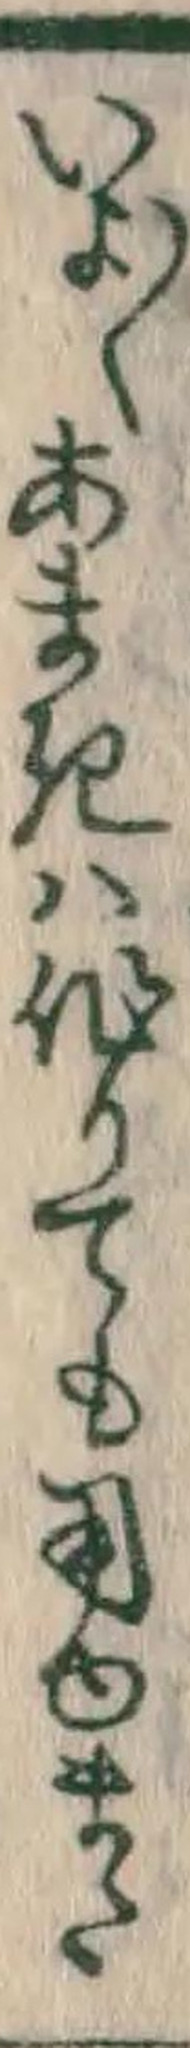いよ〳〵あまきは作りても用ゆまた
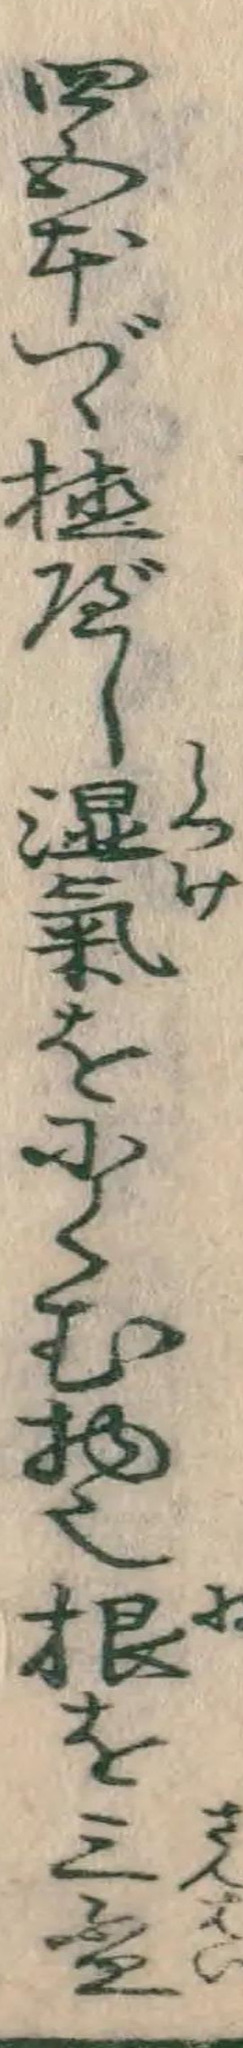四五本づゝ植べし湿気をにくむ物也根を三盃
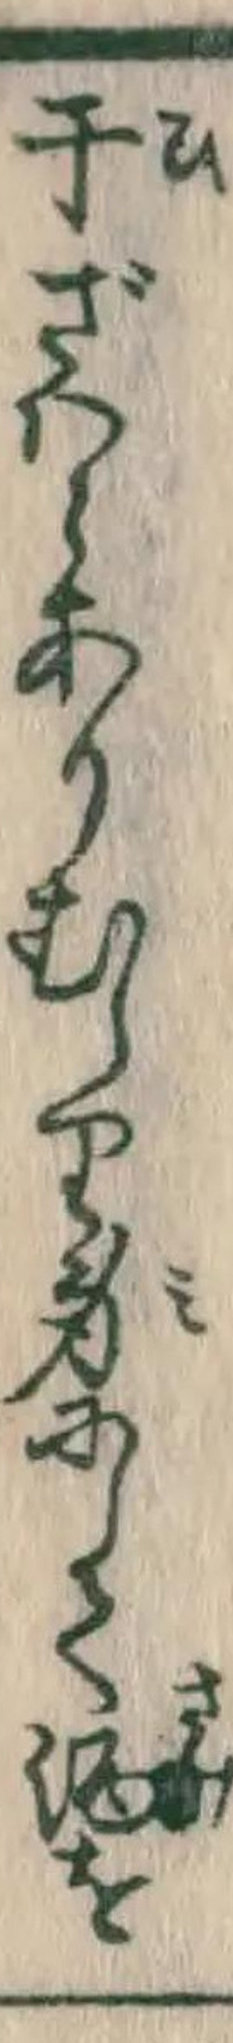干ざはらありむしり身にして酒を
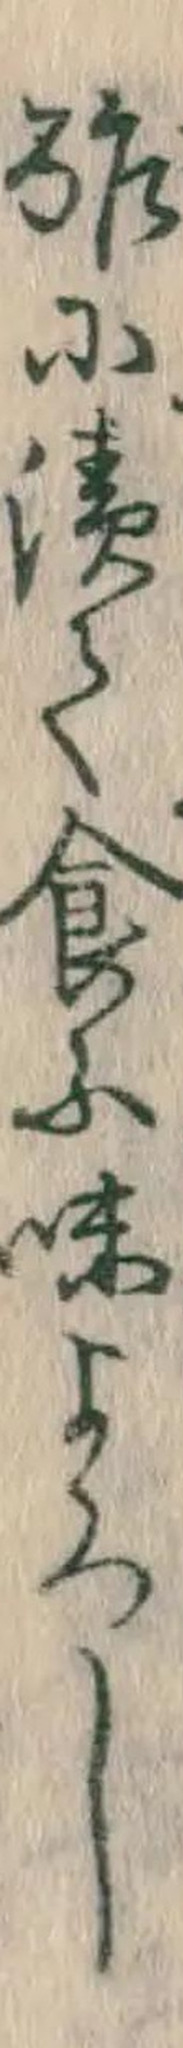酢に漬て食ふ味よろし
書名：広益秘事大全 3巻. [5]
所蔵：国立国会図書館 National Diet Library, JAPAN
